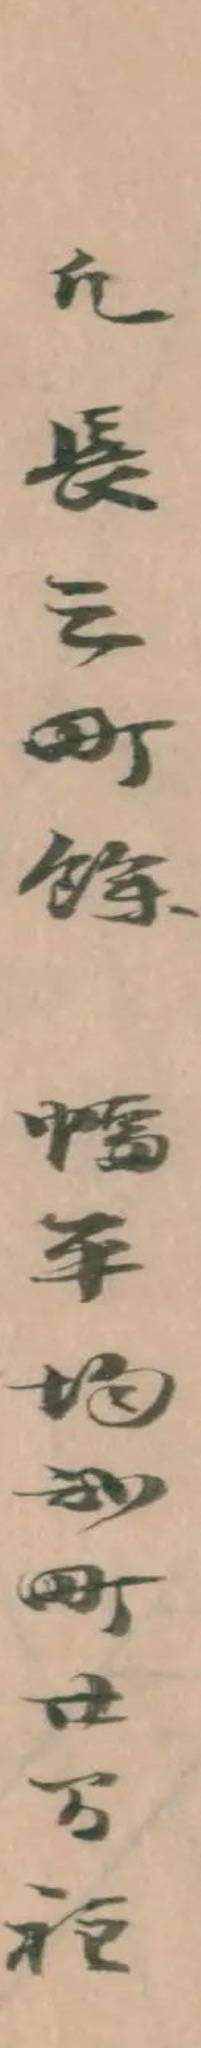凡長三町余幅平均弐町廿間程
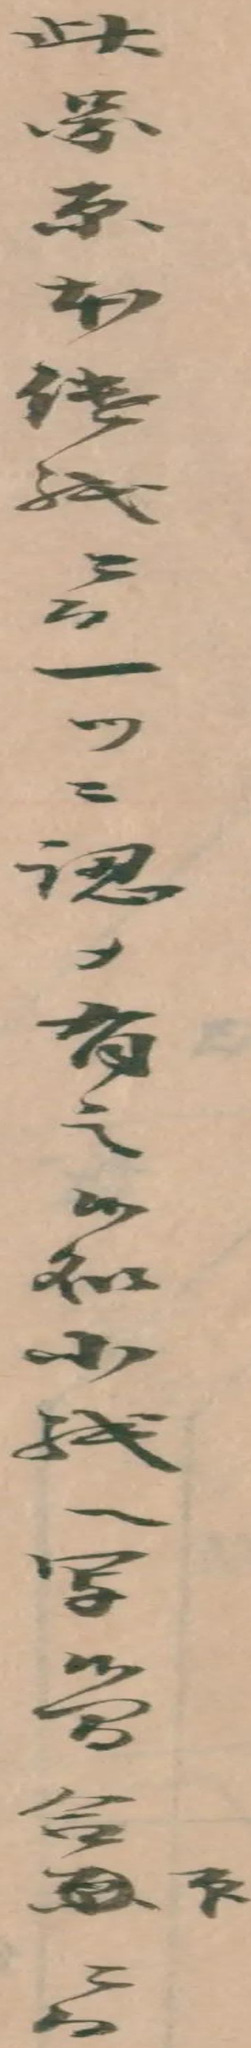此図原本継紙ニ而一ツニ認メ有之候処小紙へ写候間合印ニ而
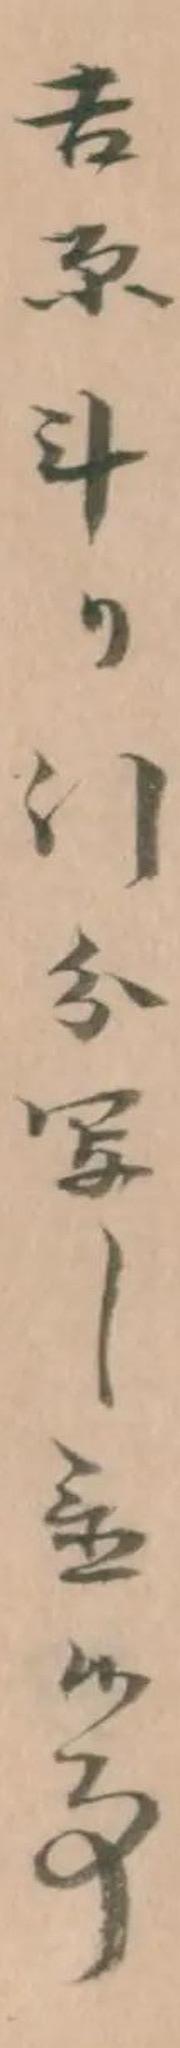吉原計リ引分写し置候事

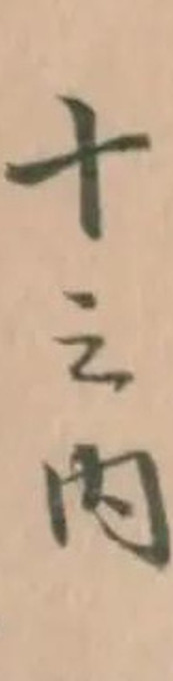十之内
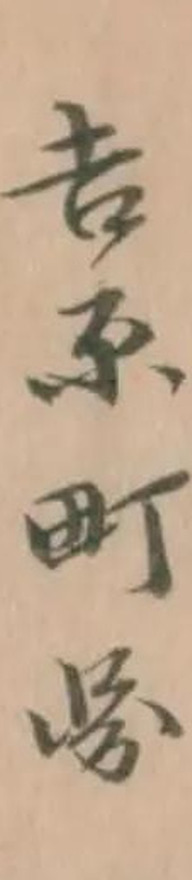吉原町図

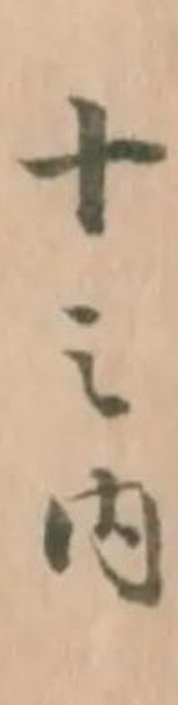十之内
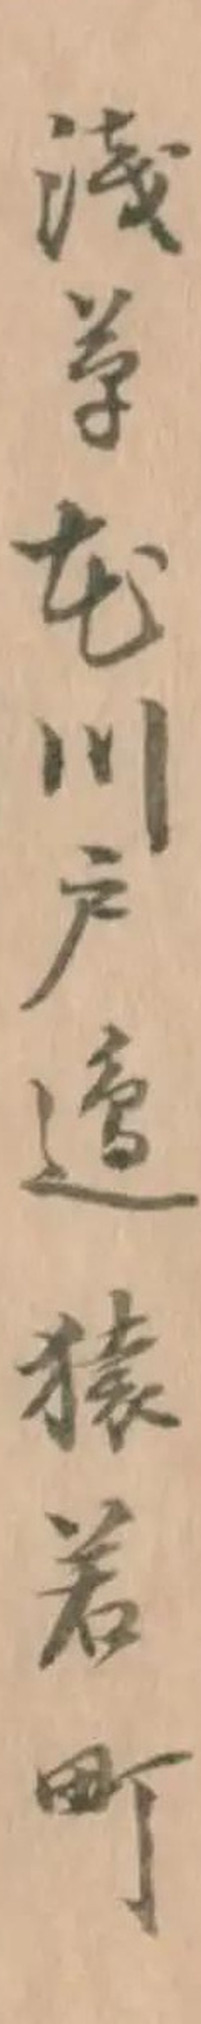浅草花川戸辺猿若町

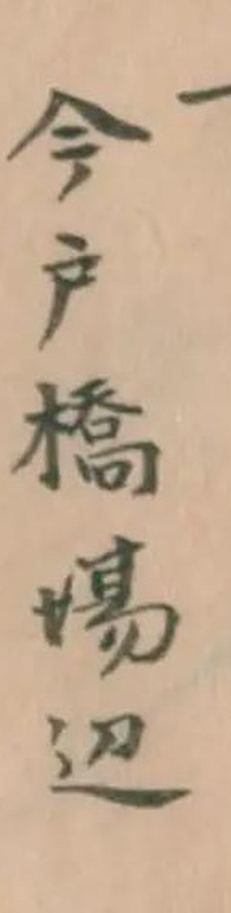今戸橋場辺

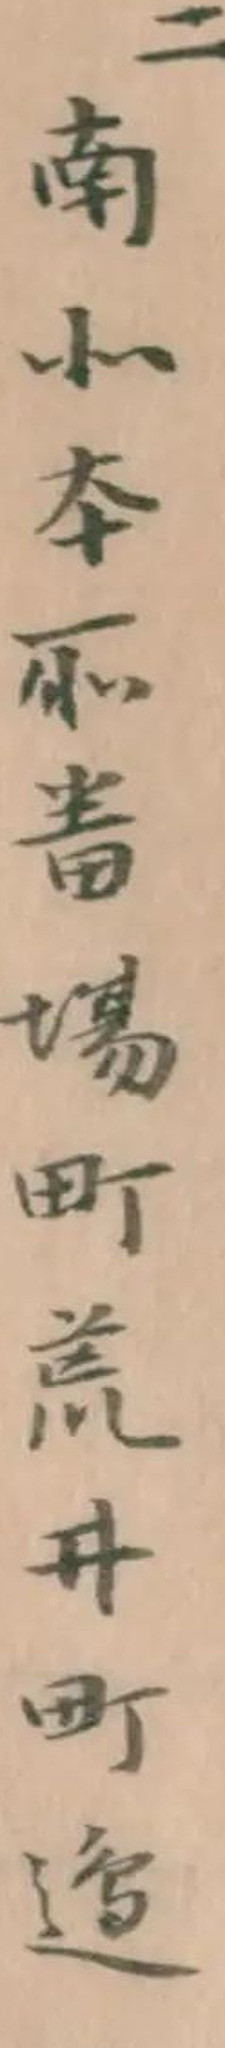南北本所番場町荒井町辺

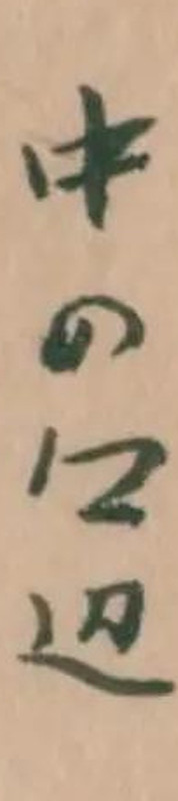中の郷辺
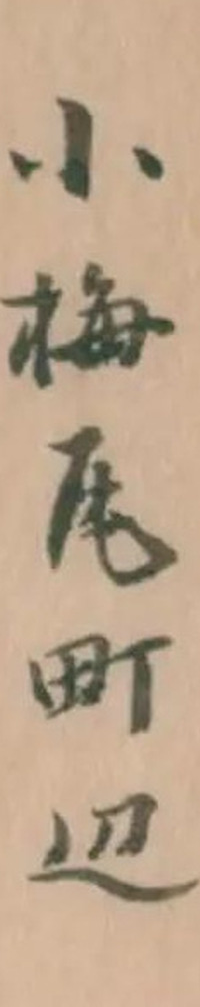小梅瓦町辺

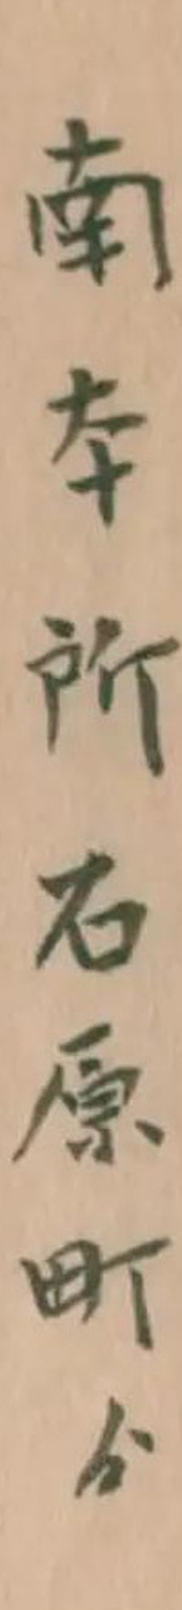南本所石原町ゟ
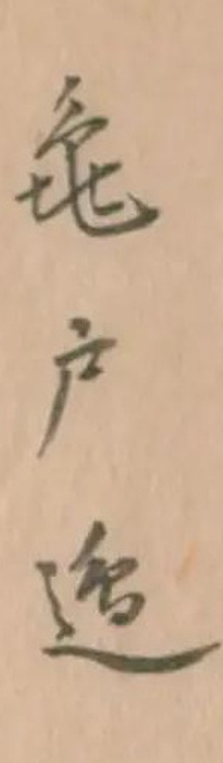亀戸辺

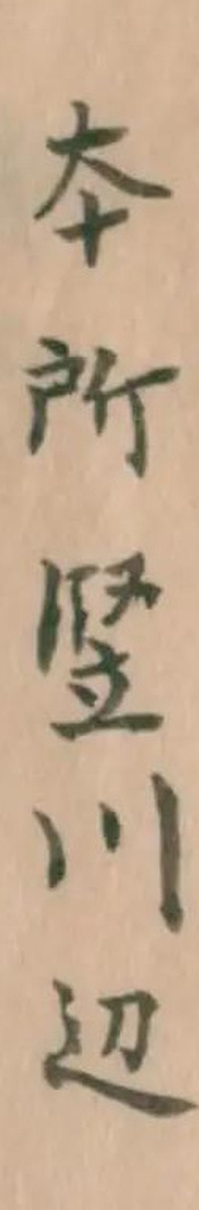本所竪川辺

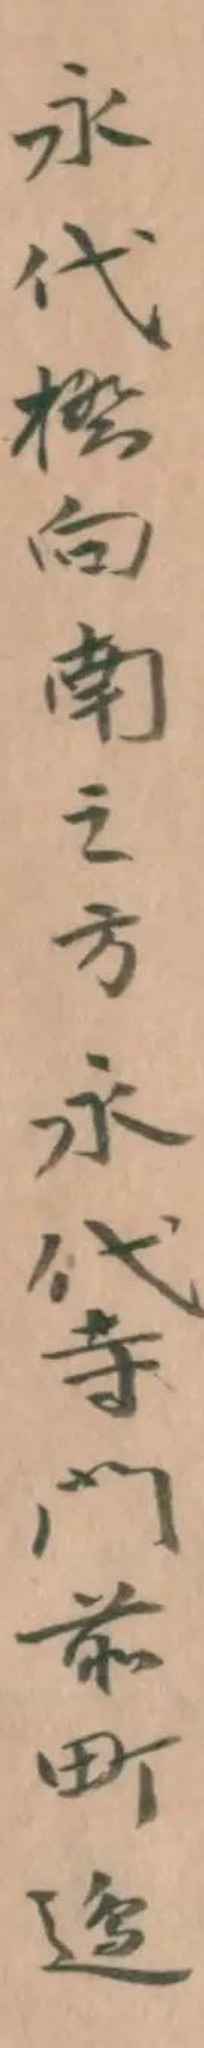永代橋向南之方永代寺門前町辺

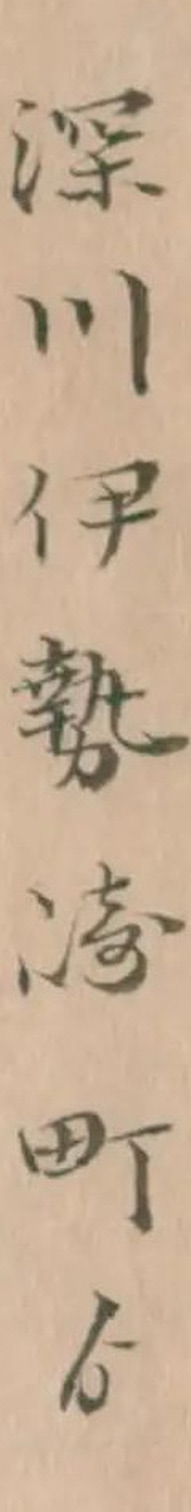深川伊勢崎町ゟ
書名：地災撮要. 巻7-9(地震之部)
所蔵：国立国会図書館 National Diet Library, JAPAN
